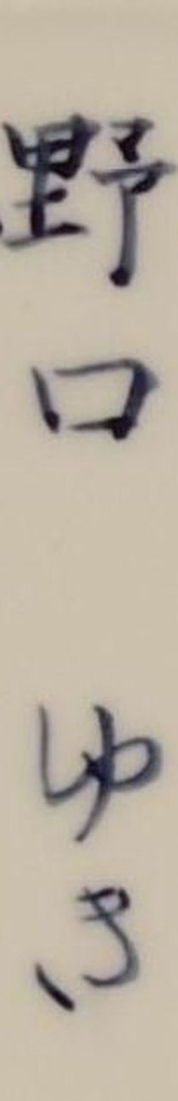野口ゆき
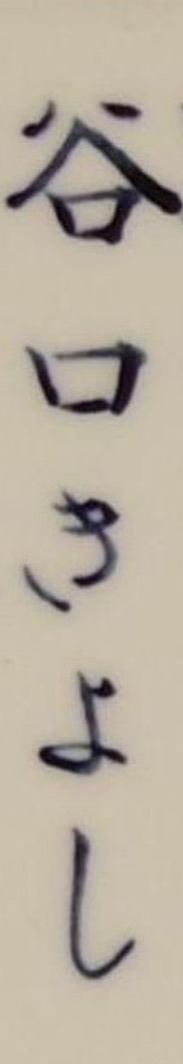谷口きよし
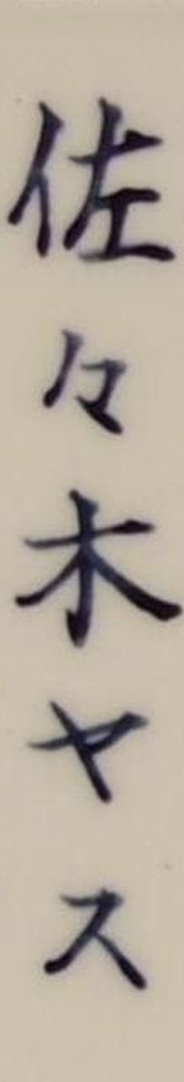佐々木ヤス
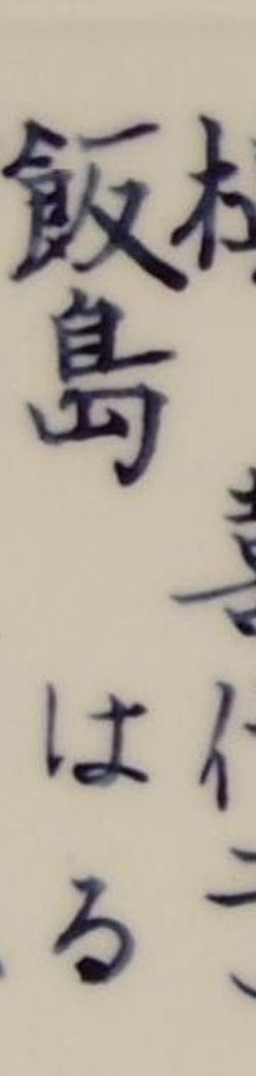飯島はる

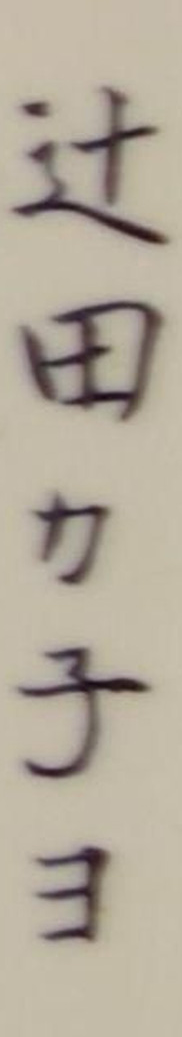辻田カコヨ
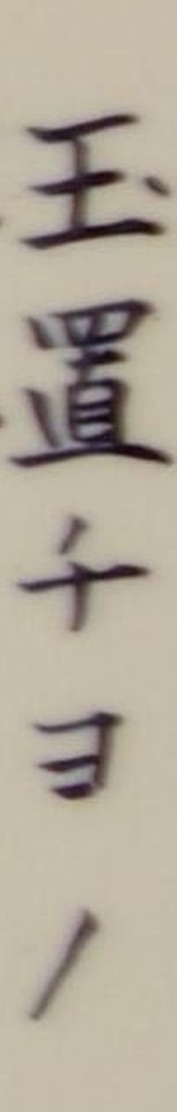玉置チヨノ
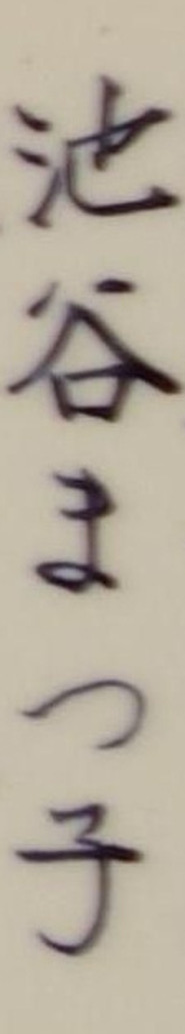池谷まつ子
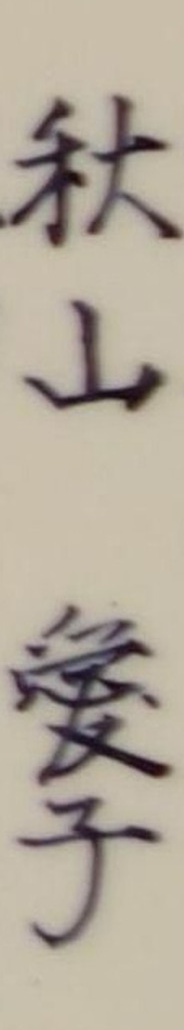秋山愛子
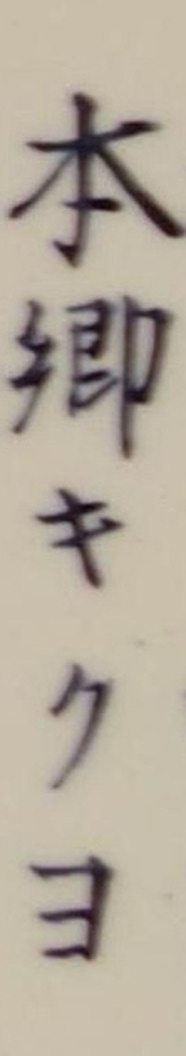本郷キクヨ
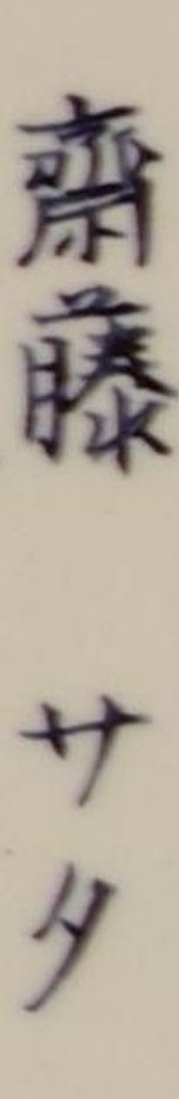斎藤サタ
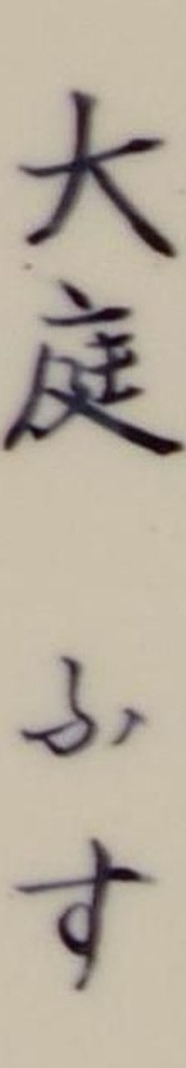大庭ふす
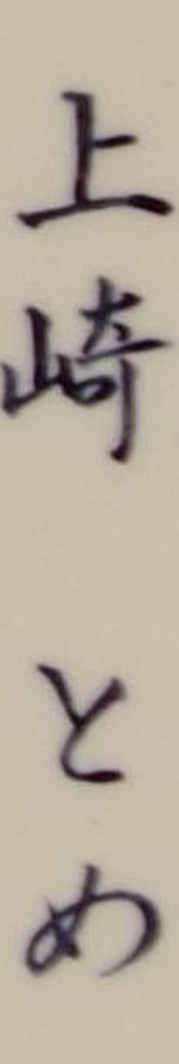上崎とめ
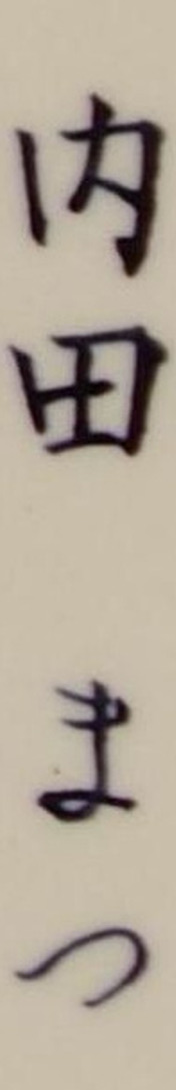内田まつ
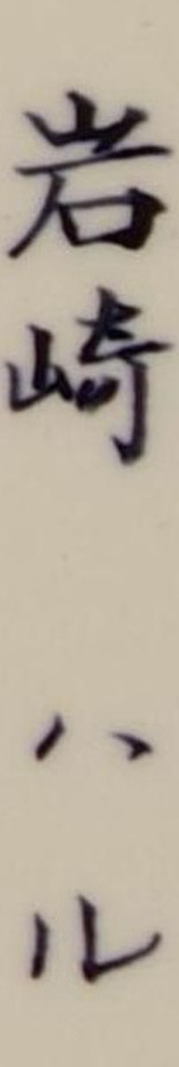岩崎ハル
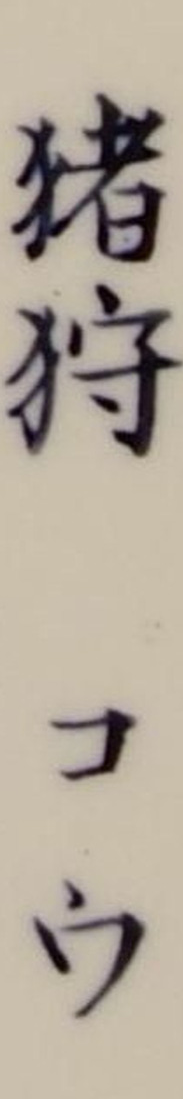猪狩コウ
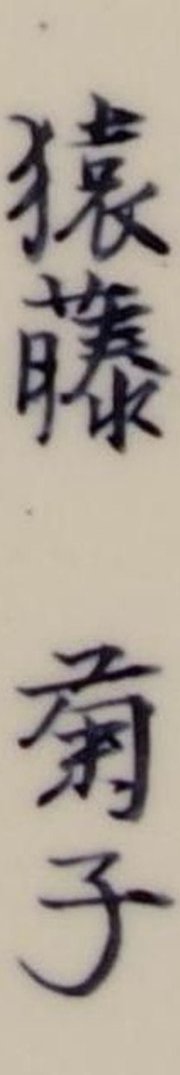猿藤菊子
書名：M~S
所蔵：高野山金剛峯寺
